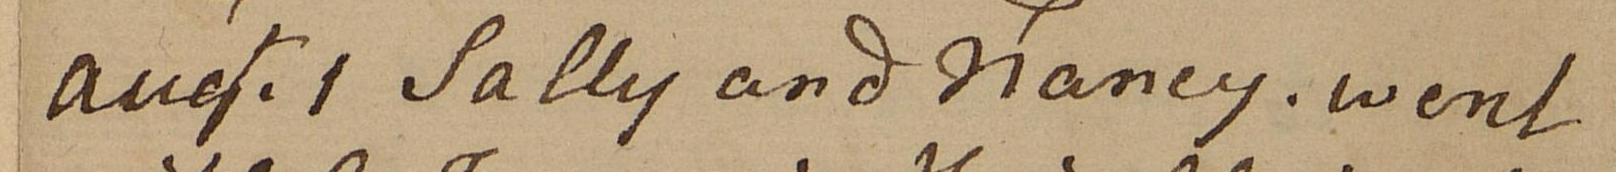Aug^t. 1 Sally and Nancy. went
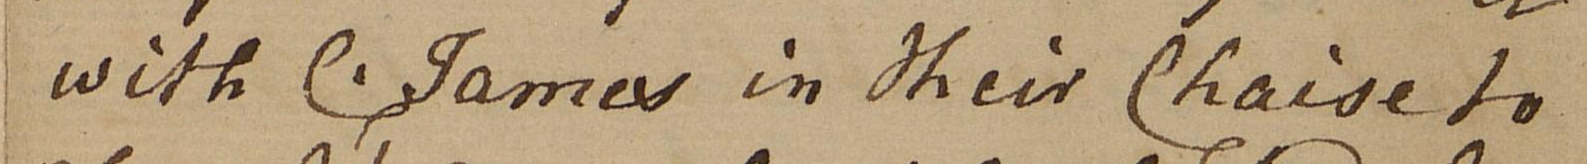with C. James in their Chaise to
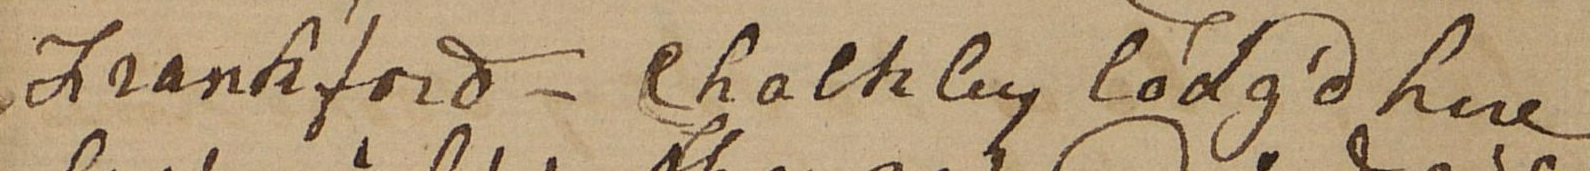Frankford- Chalkley lodg'd here
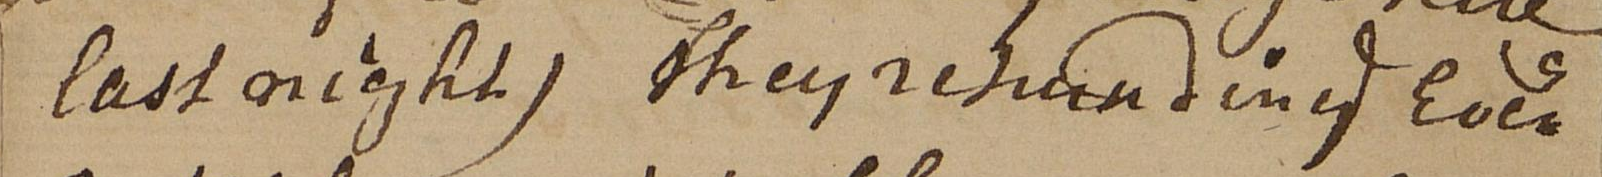last night) they returnd in y^e Even^g
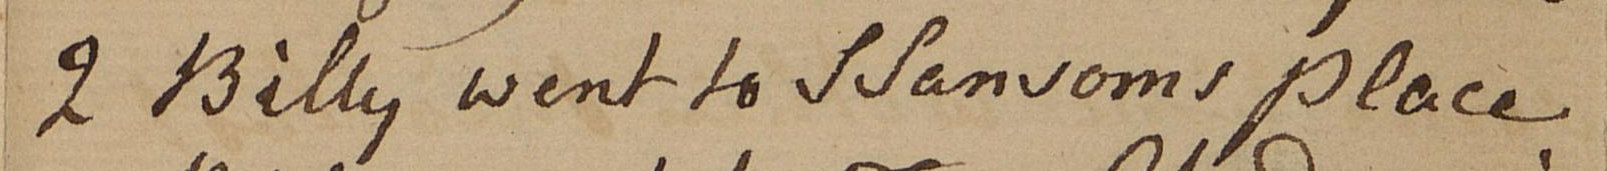2 Billy went to S Sansoms place
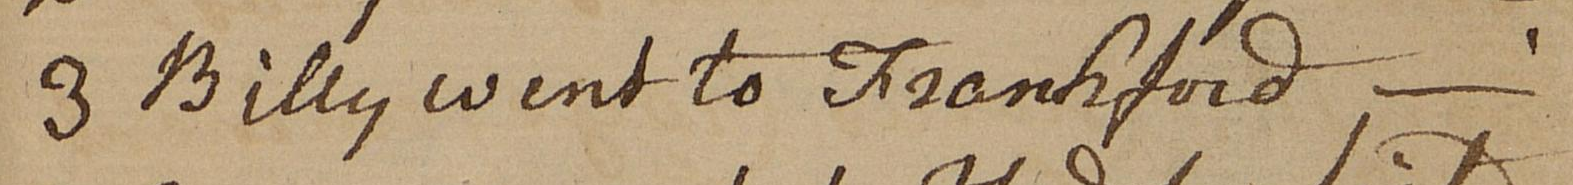3 Billy went to Frankford-
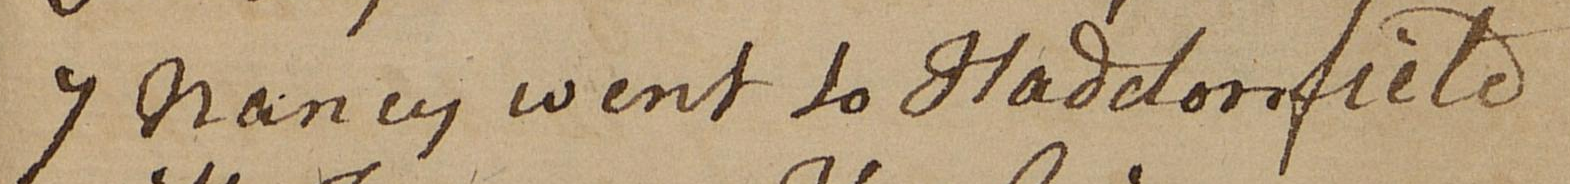7 Nancy went to Haddonfield
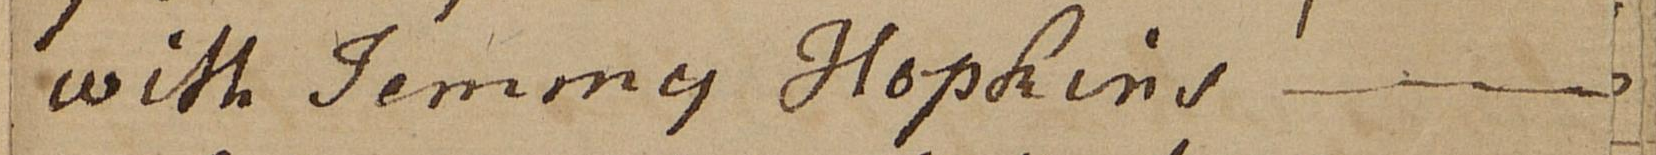with Jemmy Hopkins-
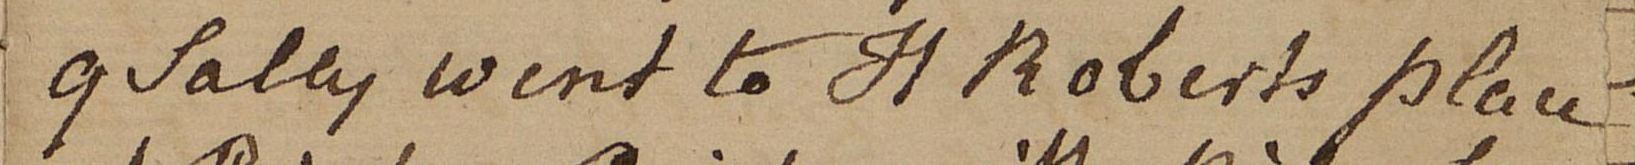9 Sally went to H Roberts place
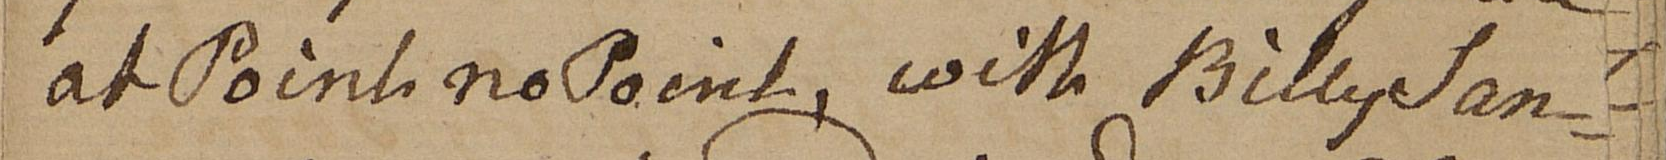at Point no Point, with Billy San-
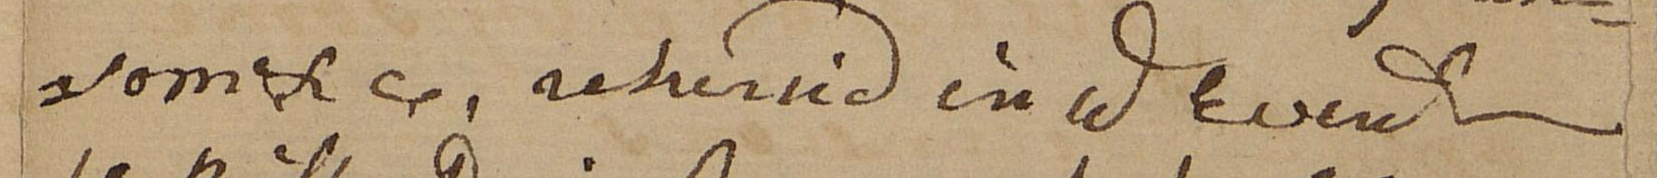-som &c, return'd in y^e Even^g-
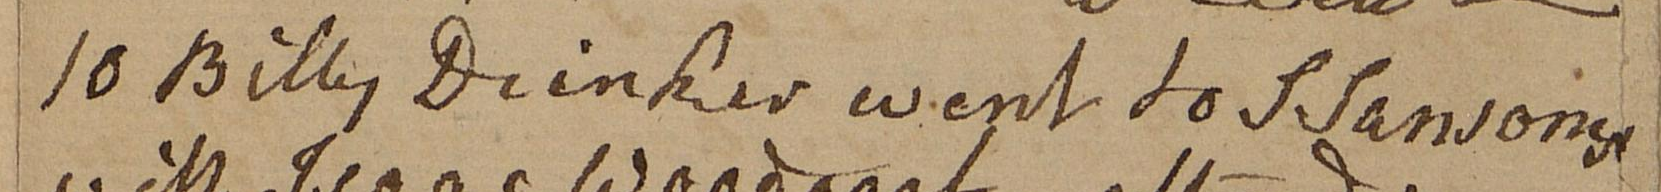10 Billy Drinker went to S Sansoms
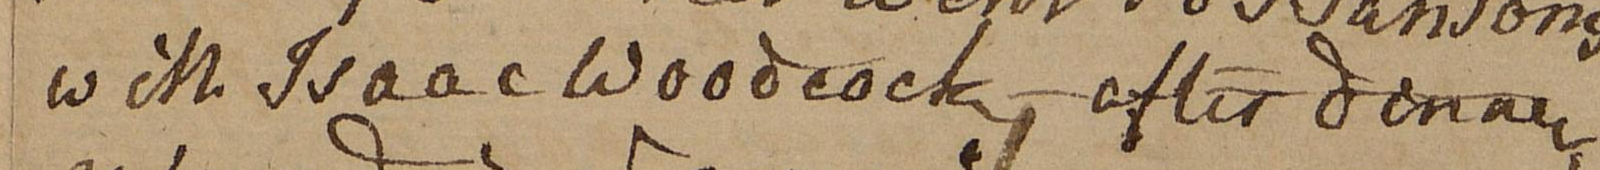with Isace Woodcock after dinner
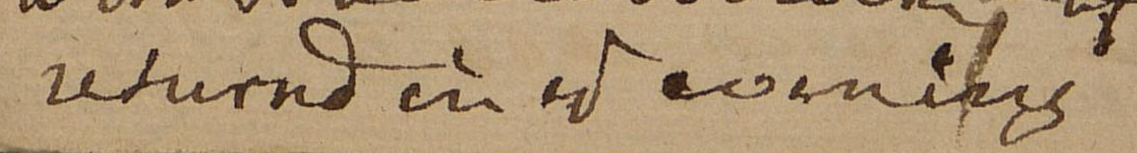returnd in y^e evening
